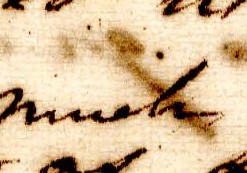much
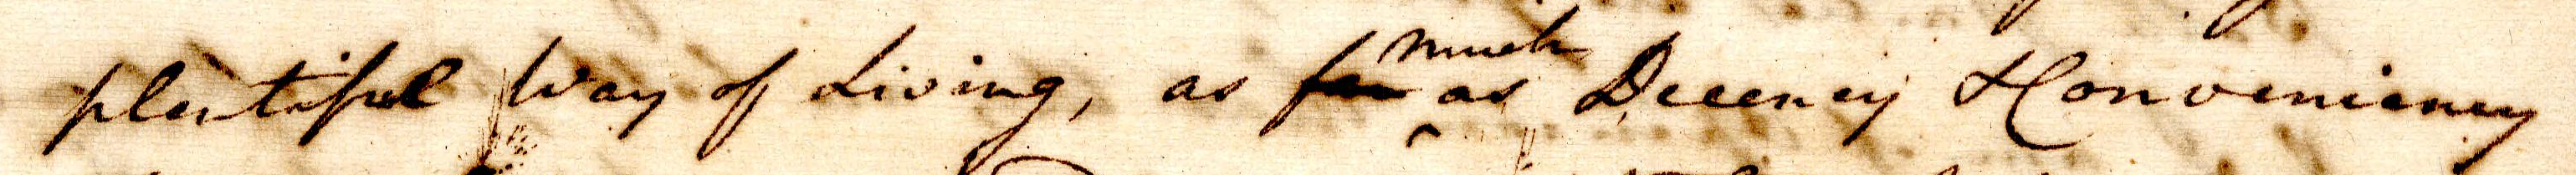plentiful Way of Living, as for ^ as Decency & Conveniency
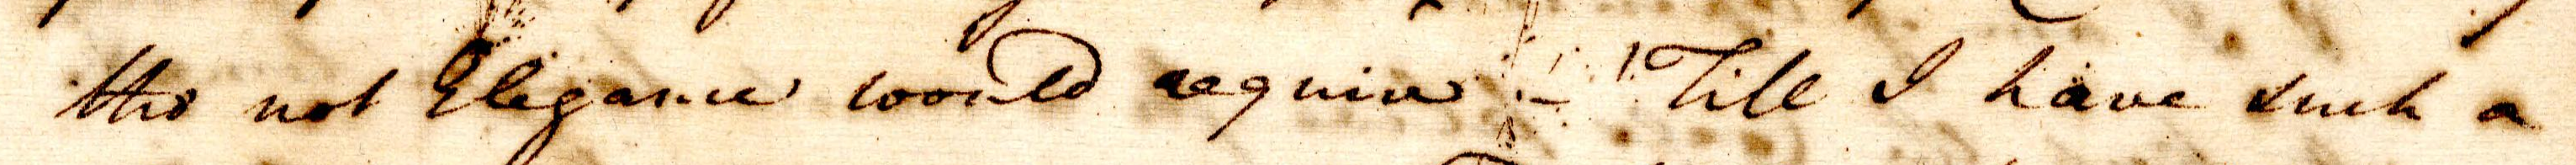tho' not Elegance coould require.- 'Till I have such a
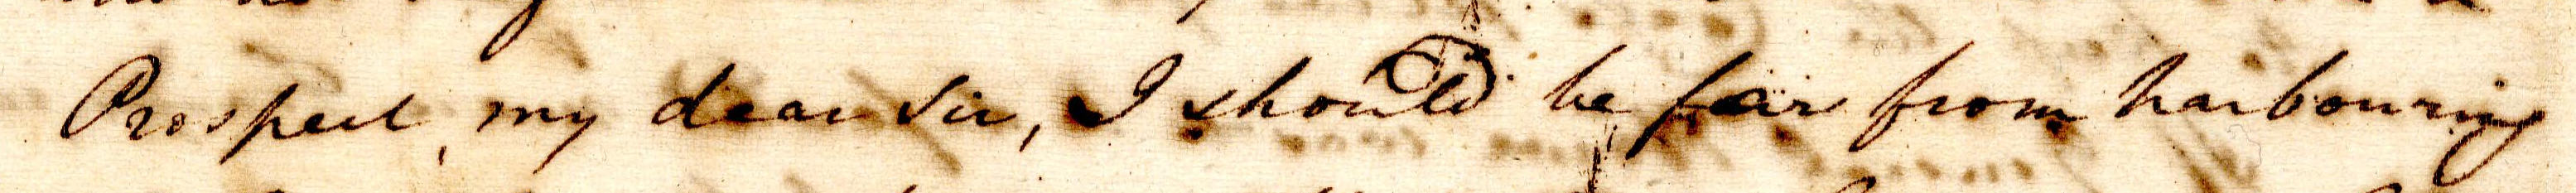Prospect, my dear sir, I should be far from harbouring
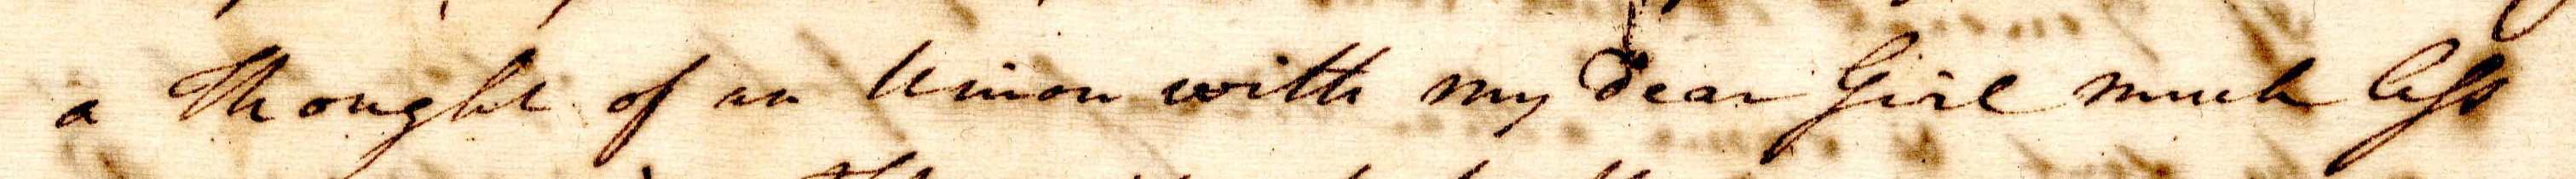a thought of an Union with my dear Girl much less
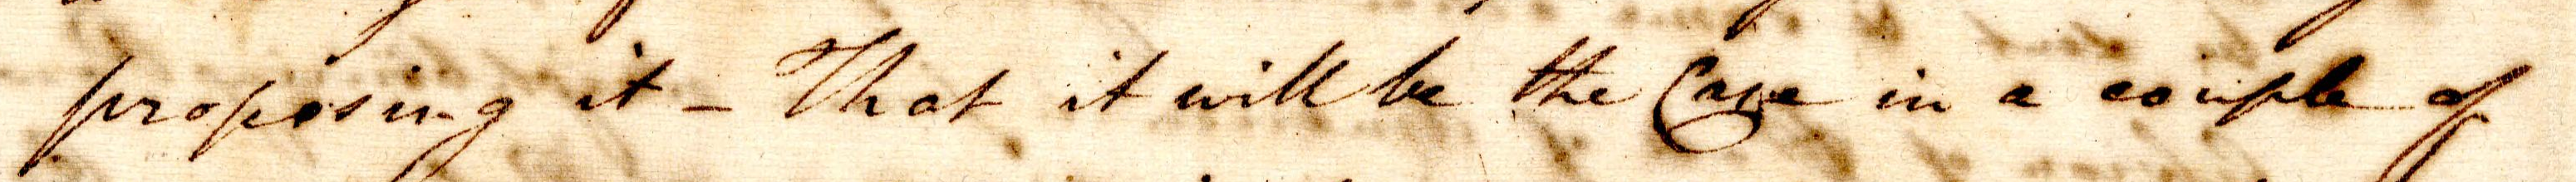proposing it- That it will be the Case in a couple of
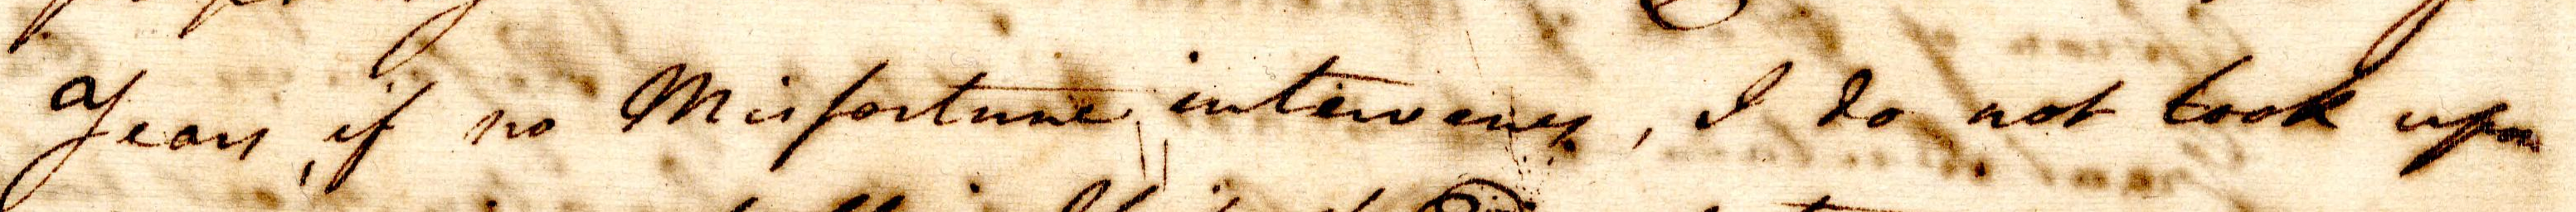Years if no Misfortune intervenes, I do not look upon
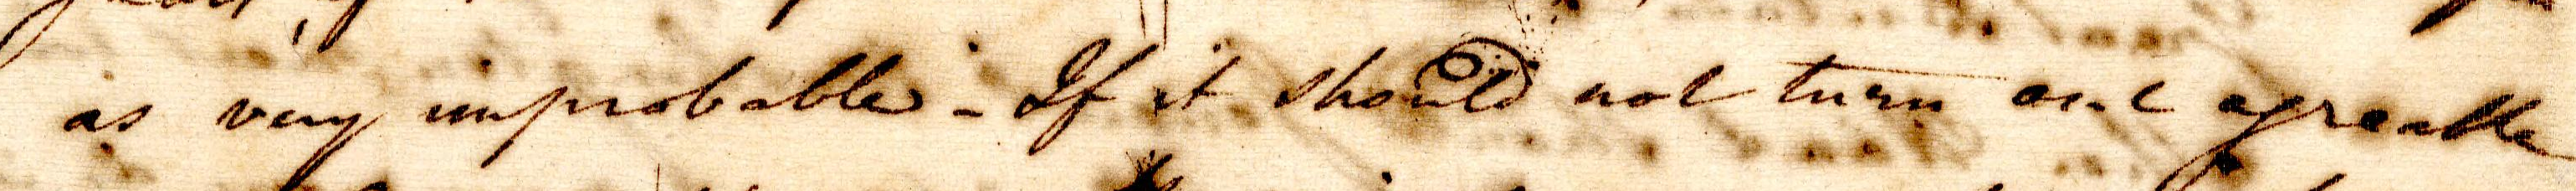as very improbable- If it should not turn one agreable
